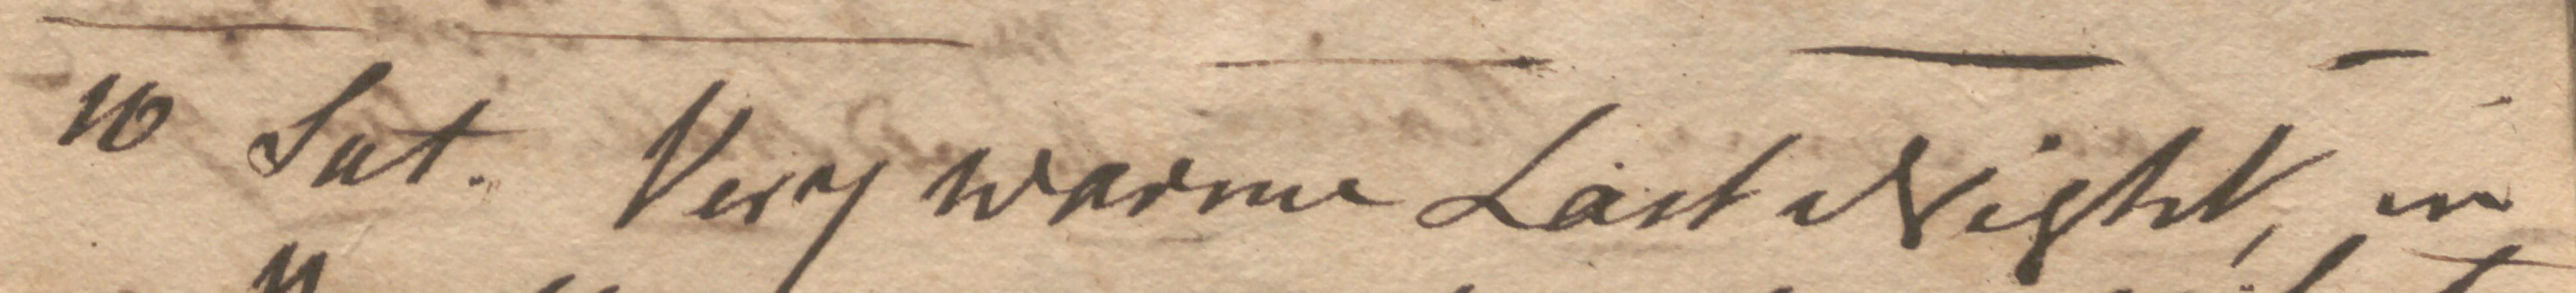10 Sat. Very warme Last Night, in
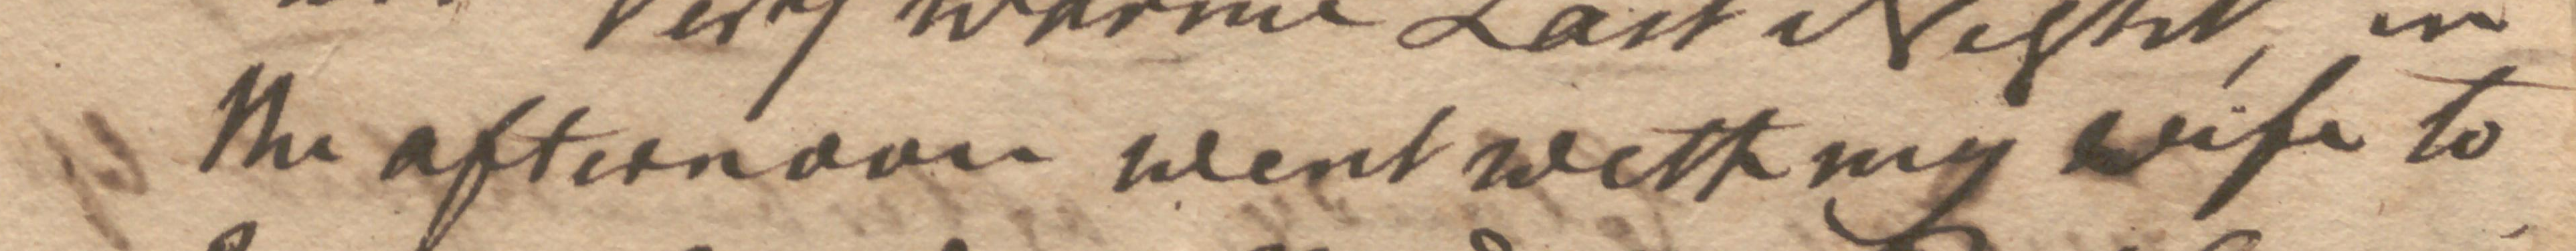the afternoon went with my wife to
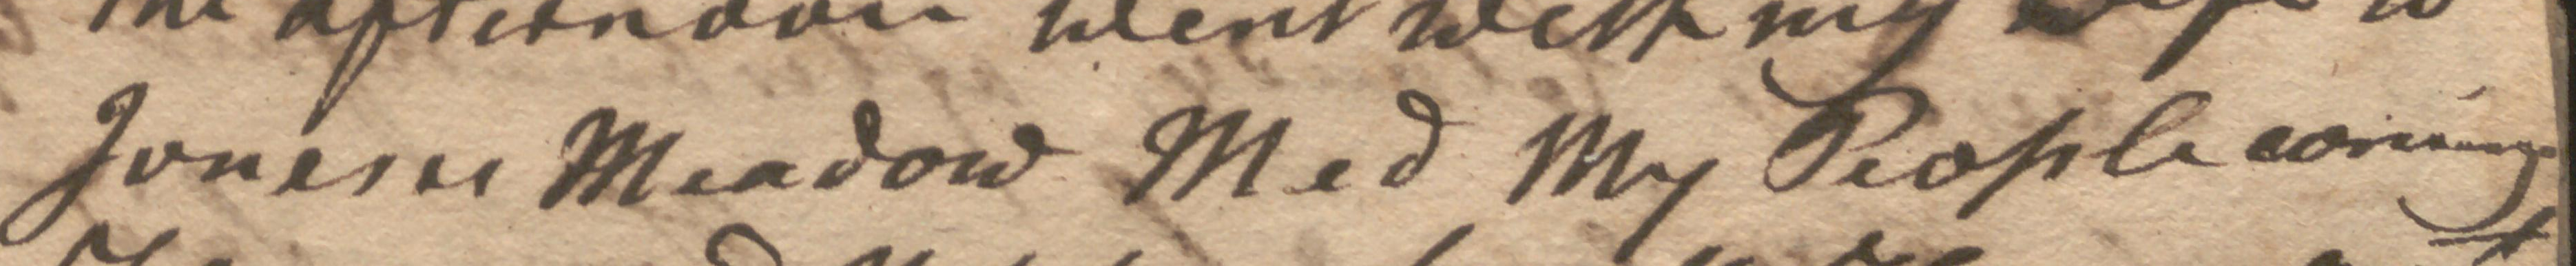Joneses Meadow Med My People coming
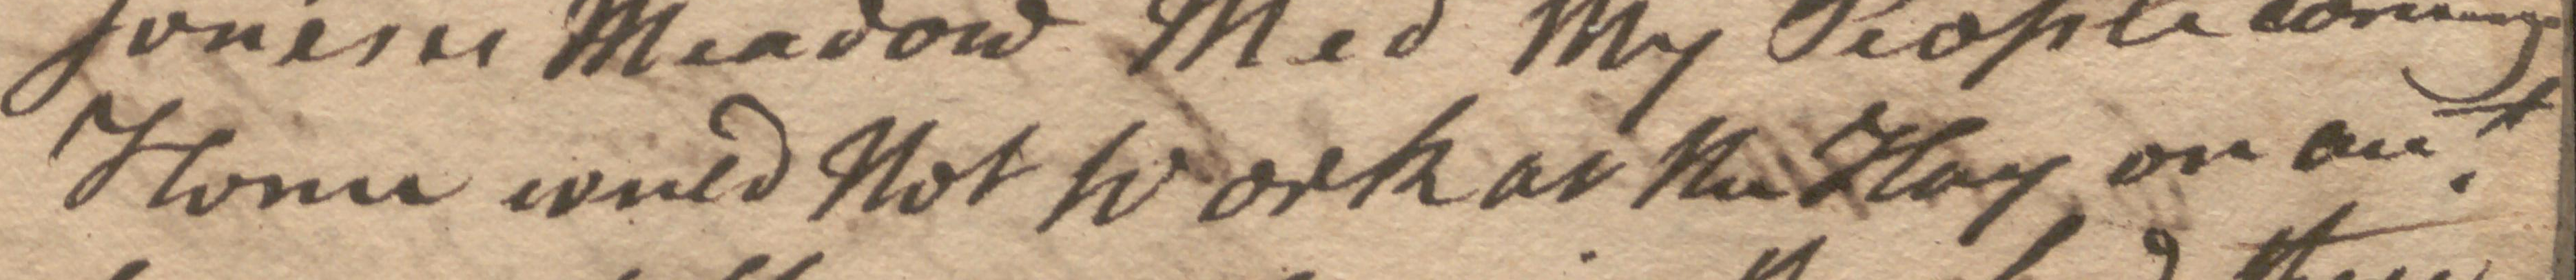Home could Not work as the Hay on acc^t.
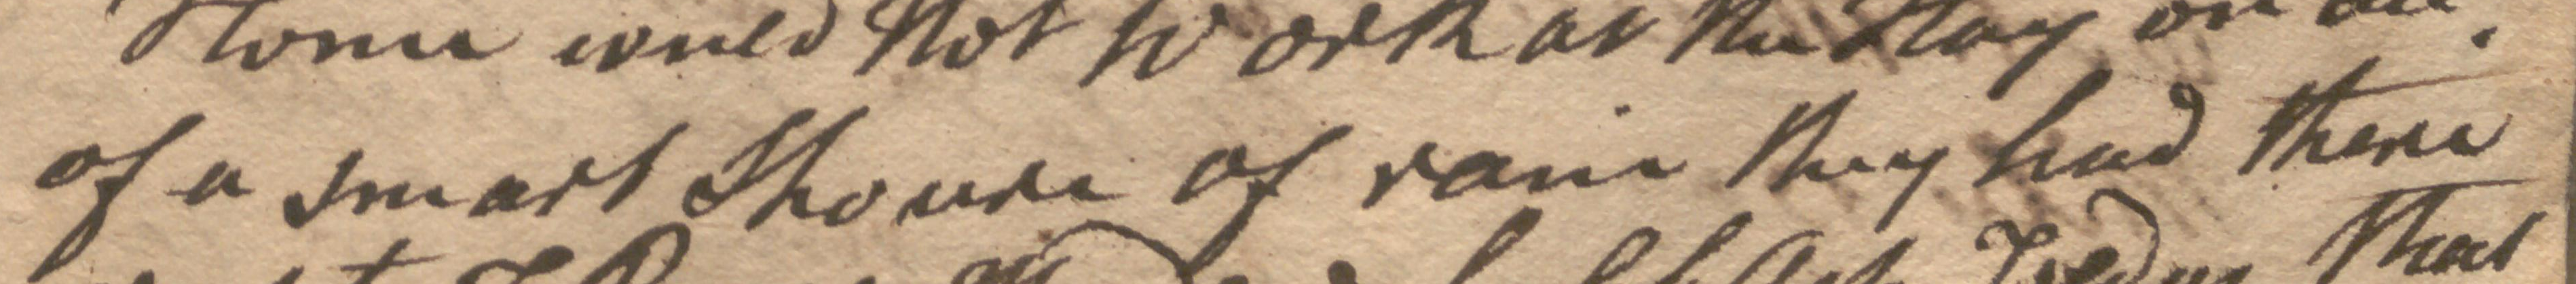of a smart Shoure of rain they had there
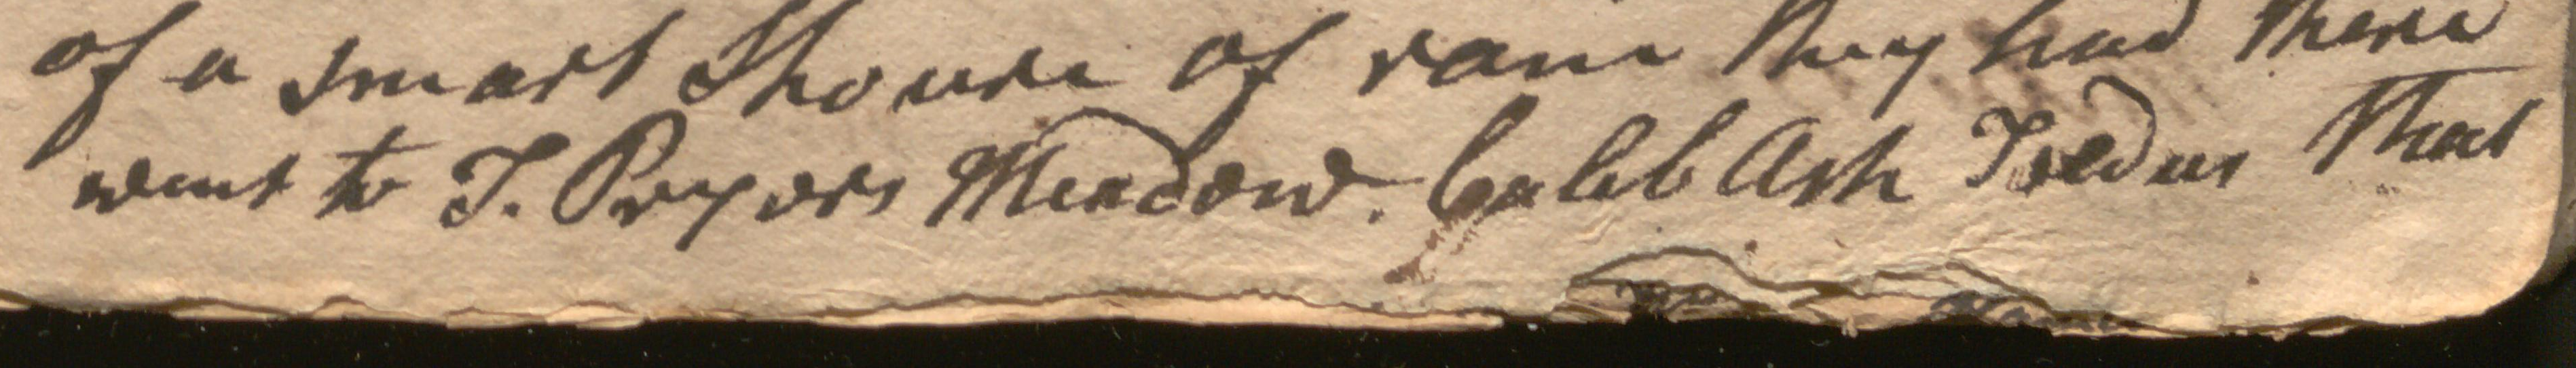went to T. Pryors Meadow. Caleb Ash Told us that
